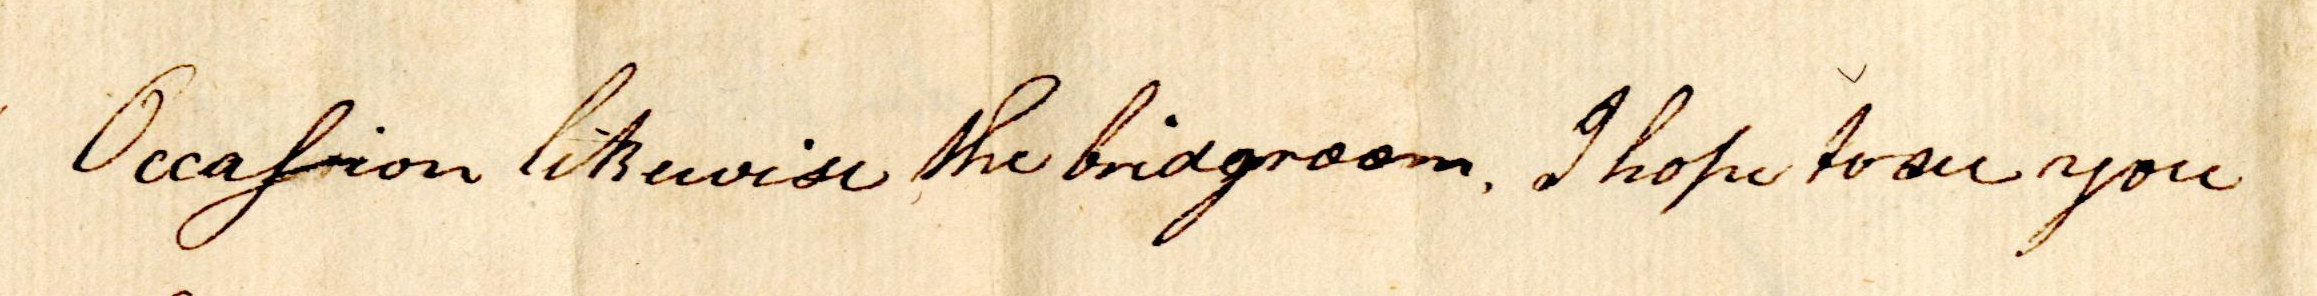Occassion likewise the bridgroom. I hope to see you
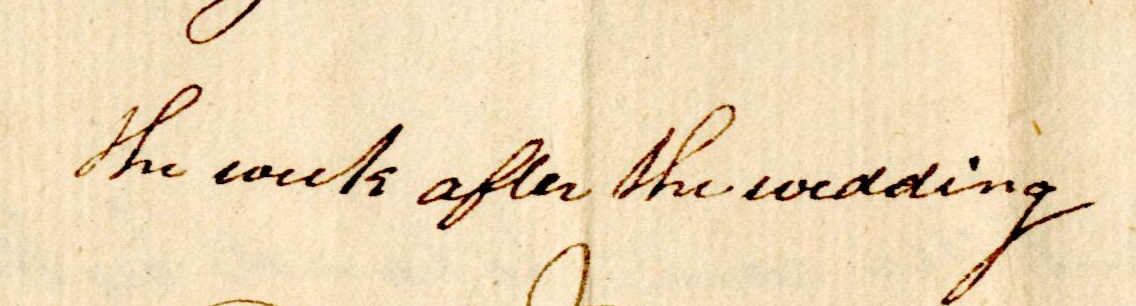the weeks after the wedding
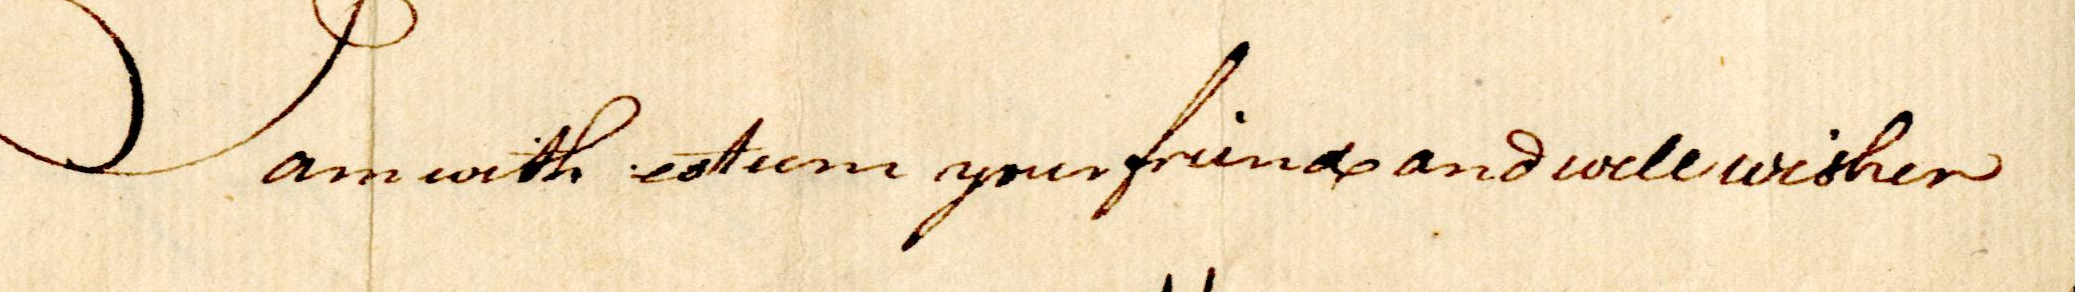I am with esteem your friend and well wisher
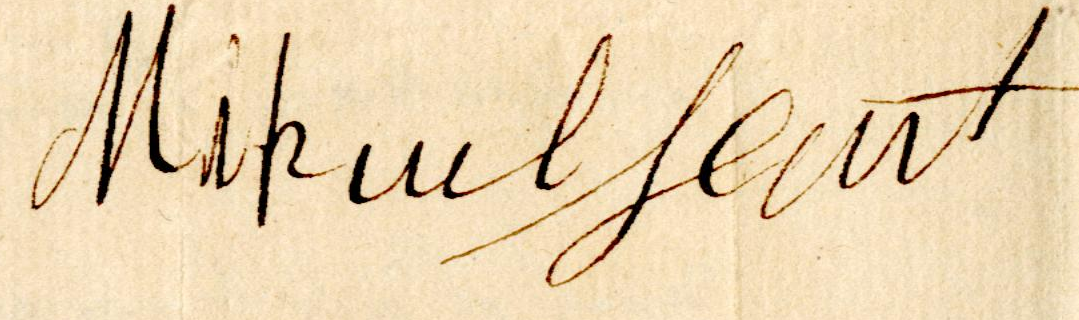Mikael Hen^t
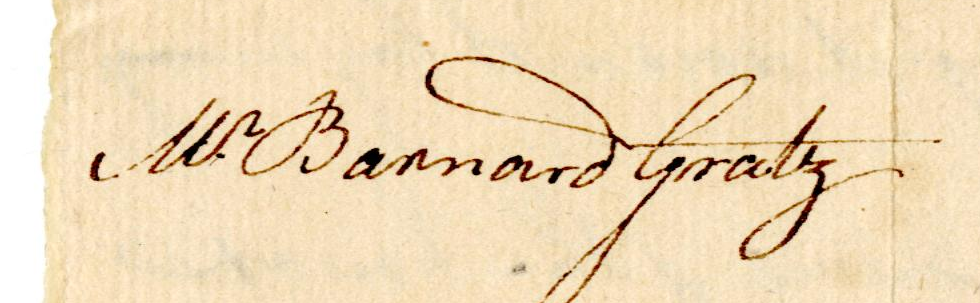M^r Barnard Gratz
